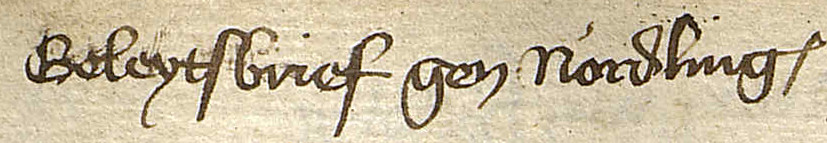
Geleytbrief gen Nördling*
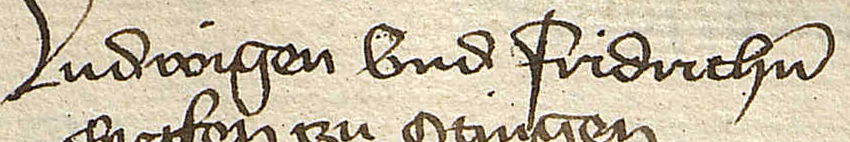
Ludwigen vnd Fridrichn*
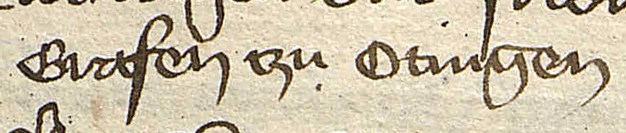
Grafen cʒu Otingen
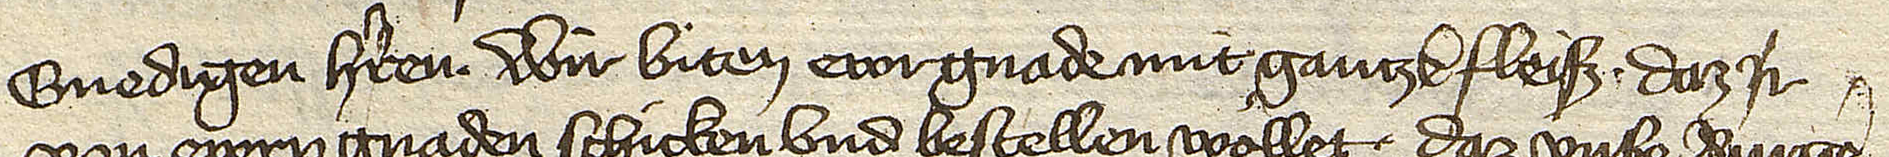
Gnedigen h*ren . Wir biten ewr gnade mit gancʒe* fleiſʒ . daʒ Ir
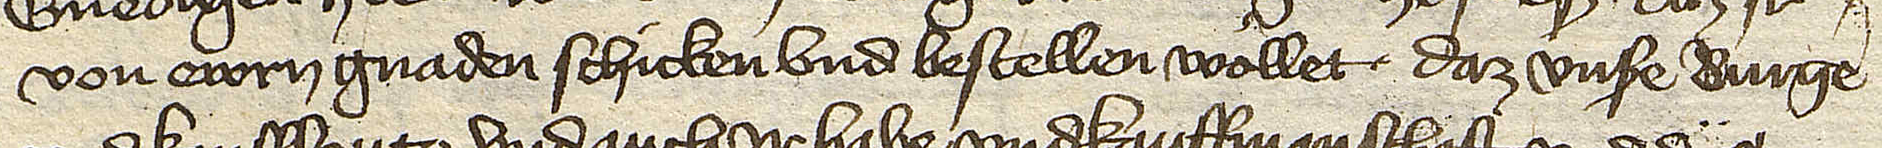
von ewrn gnaden ſchicken vnd beſtellen wöllet / daʒ vnſ*e Burge*
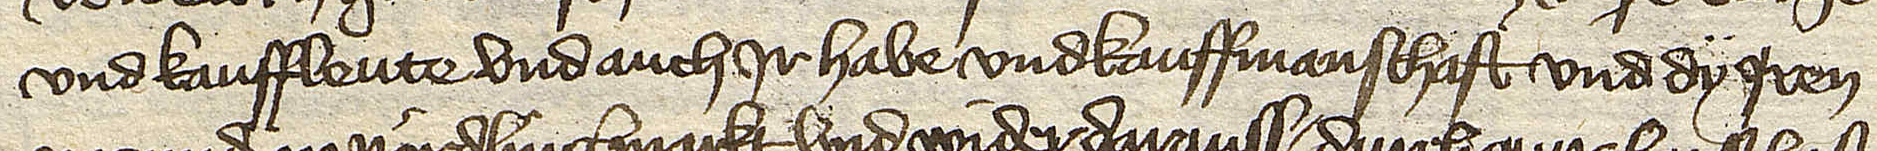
vnd kauffleute vnd auch Ir habe vnd kauffmanſchaft vnd dy Iren
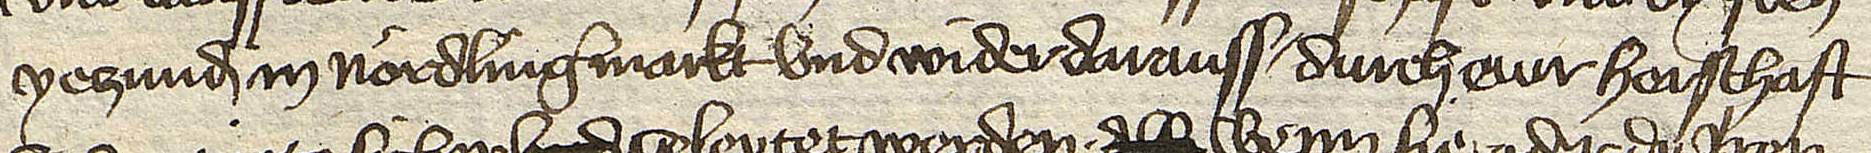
yecʒund in Nördling* markt vnd wider darauſſ / durch ewr herſchaft
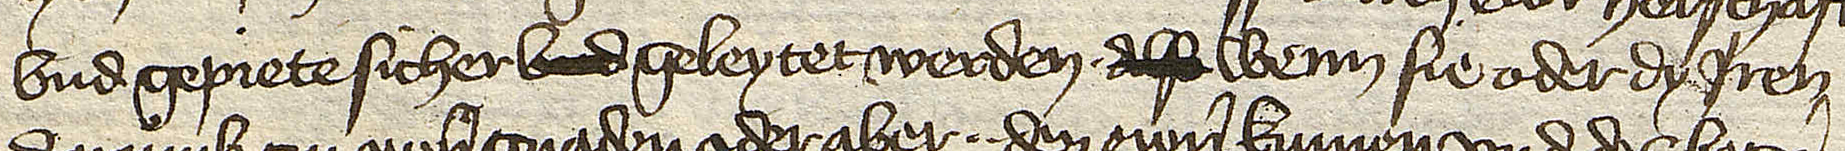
vnd gepiete ſicher vnd geleytet werden / Alſo wenn ſie oder dy Iren
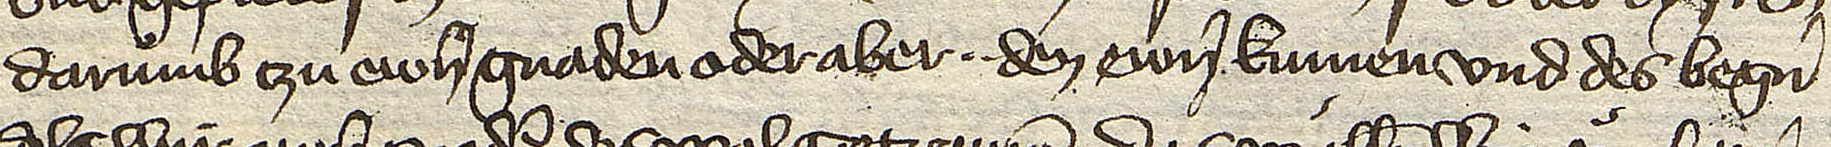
darümb cʒu ewn* gnaden oder aber ~ den ewn* kumen vnd des begn*
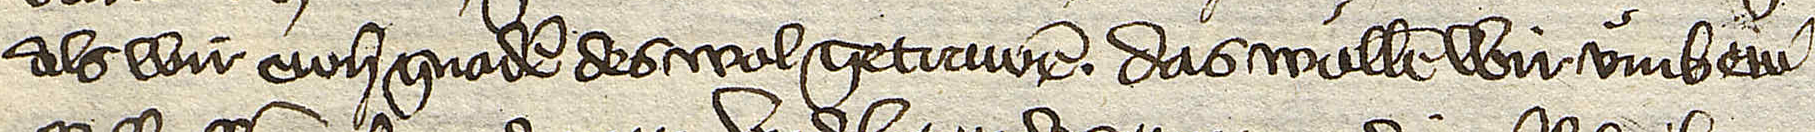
Als wir ewn* gnade* des wol getrawe* . Das wölle* wir v̈mb ew*
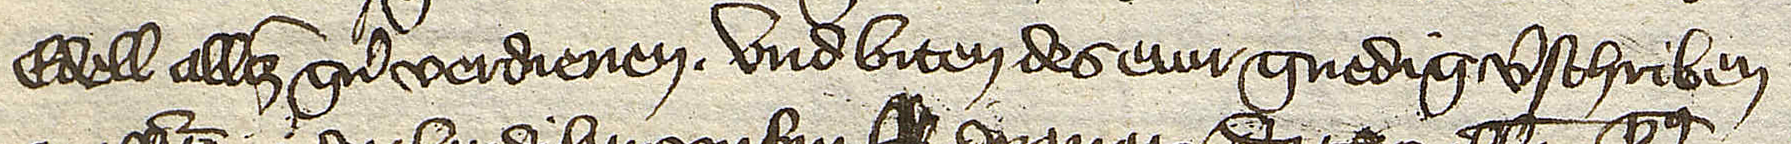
Edell allcʒ* gn* verdienen . Vnd biten des ewr gnedig v*ſchriben
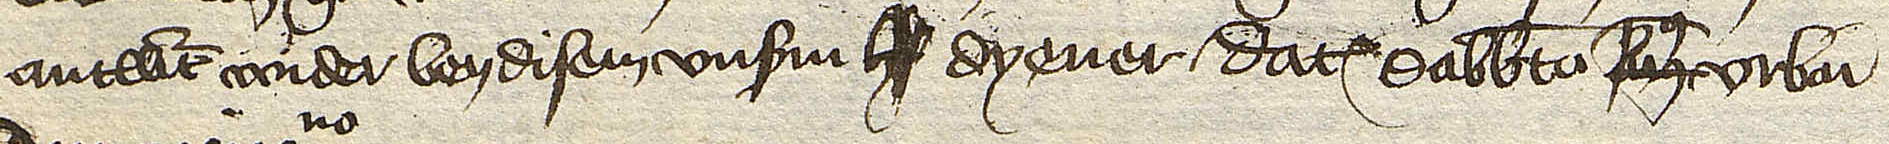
antw*t wider bey diſem vnſ*m hr* dyener / dat* Sabbto* an* vrbai*
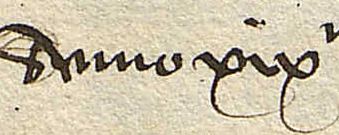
Anno xix*
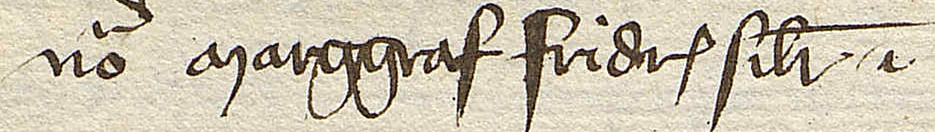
no* Marggraf Fridr* ſilr* ~
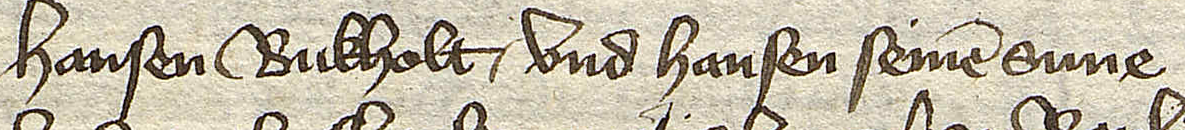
hanſen Bukholt / vnd hanſen ſeine* Sune
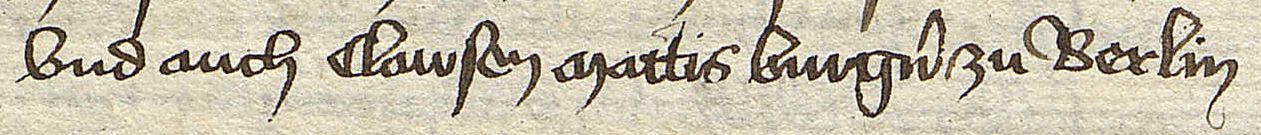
vnd auch Clawſen Mattis burgn* cʒu Berlin
